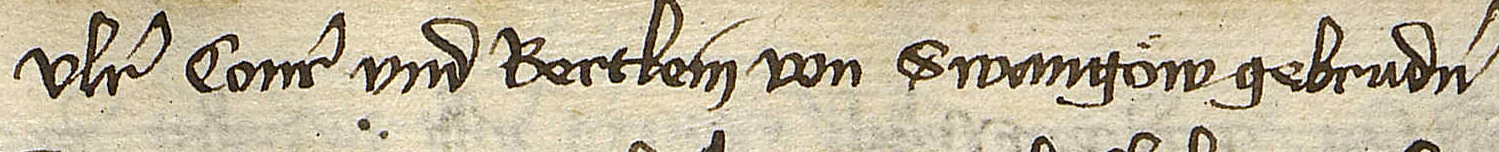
Vlr* Conr* vnd Bertlein von Swangöw gebrudn*
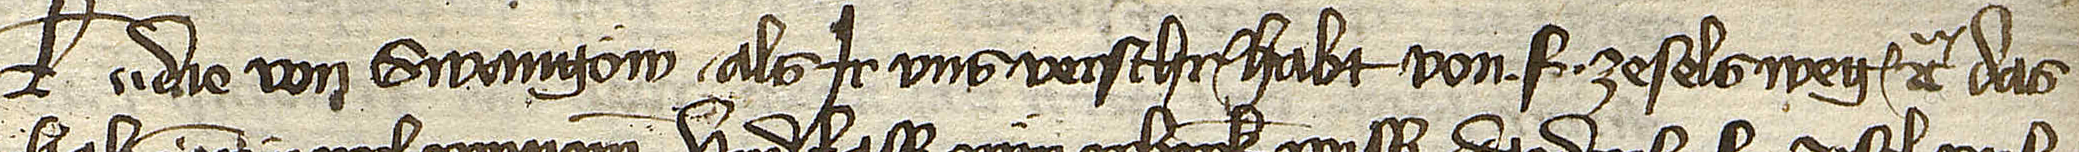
L* ~ die von Swangöw / als Ir vns verſchr* habt von . f . ʒeſels weg* ec* das
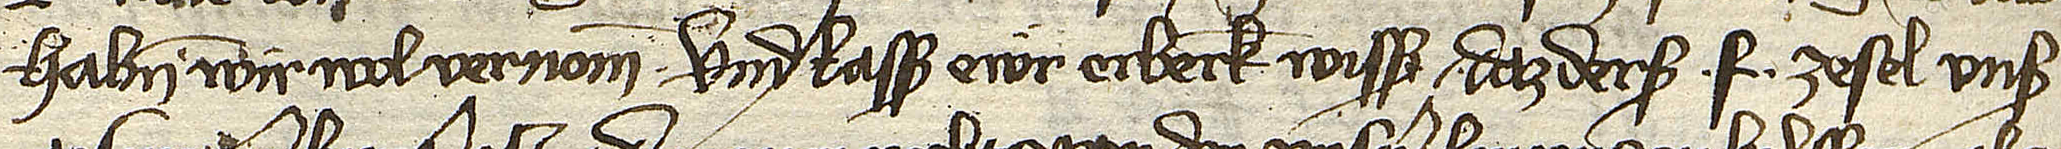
habn* wir wol vernom* . Vnd laſſ* eẅr erberk* wiſſ* / daʒ derſ* . f . ʒeſel vnſ*
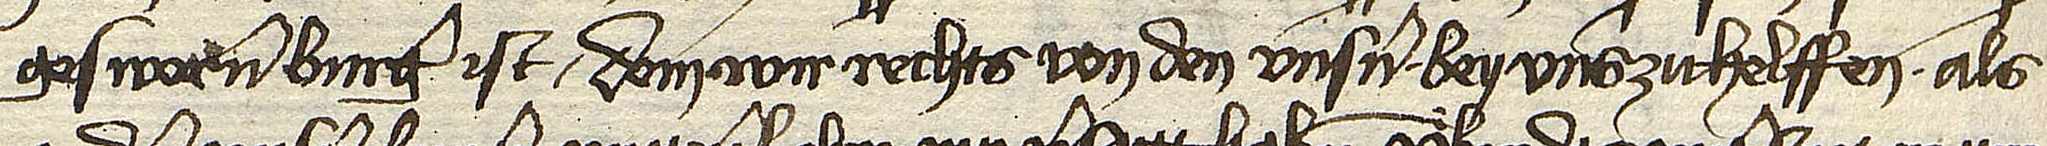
geſworn* burg* iſt / Dem wir rechts von den vnſn* / bey vns ʒu helffen . als
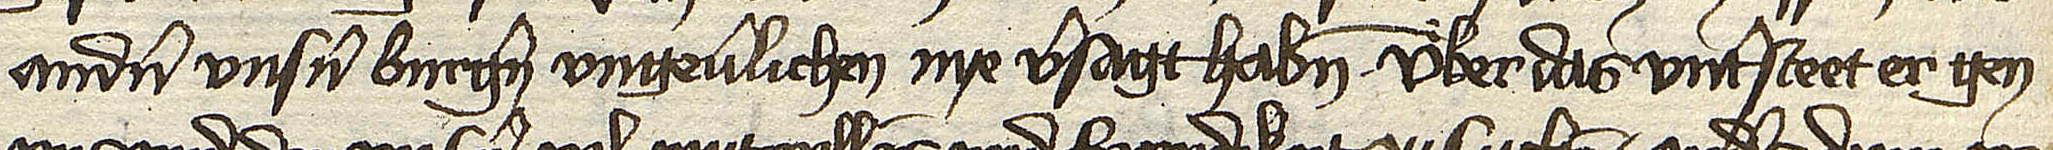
andn* vnſn* burg*n vngeu*lichen nye v*ſagt habn* / V̈ber das vnt*ſteet er gen
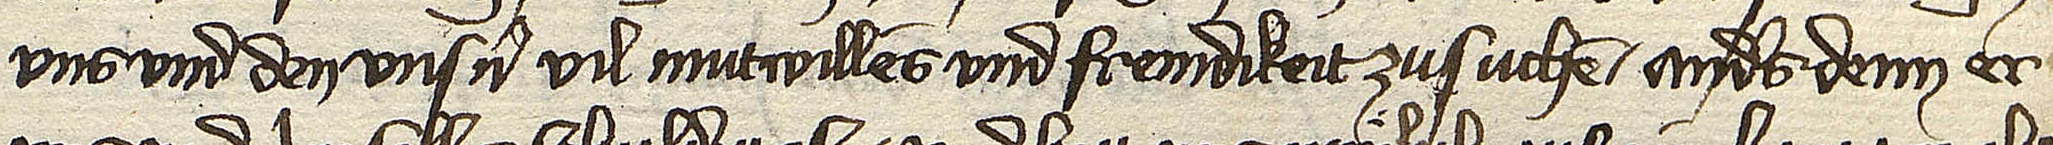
vns vnd den vnſn* vil mutwille*s vnd freudikeit ʒu ſuche* / and*s denn er
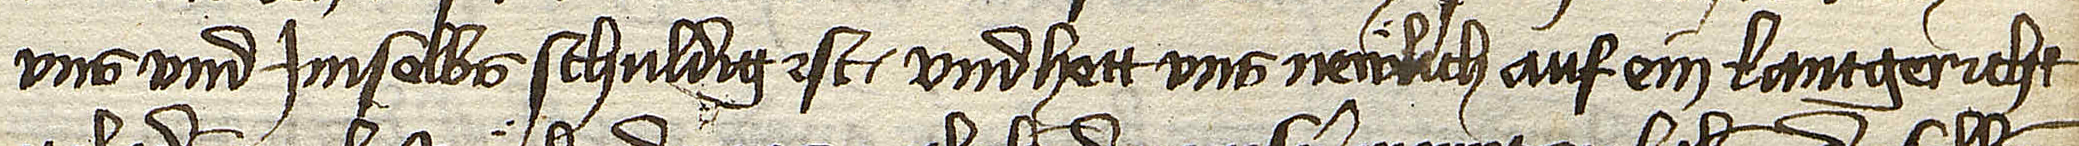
vns vnd Imſelbs ſchuldig iſt / vnd hett vns neẅlich auf ein lanthericht
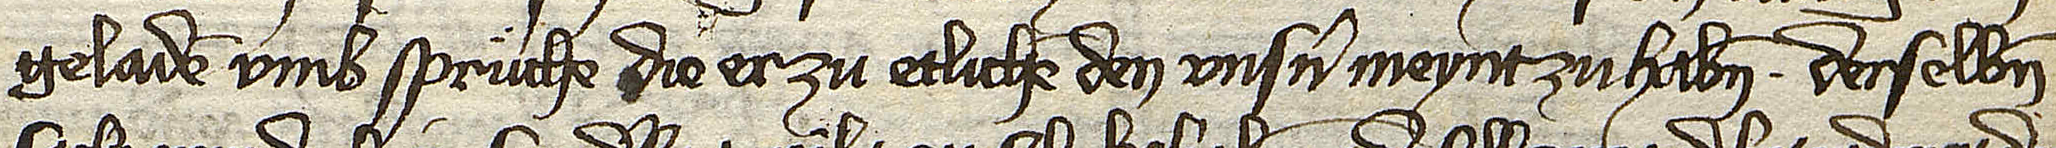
gelade* vmb ſprüche die er ʒu etliche* den vnſn* meynt ʒu habn* . Derſelbn*
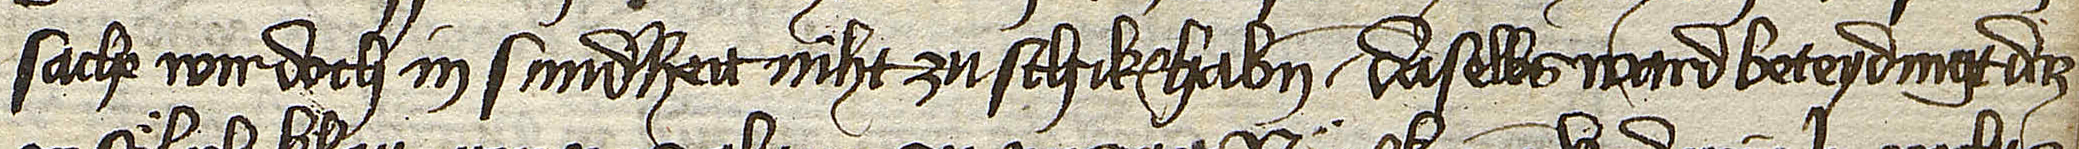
ſache wir doch in ſund*heit niht ʒu ſchik* habn* / Daſelbs ward beteydingt daʒ
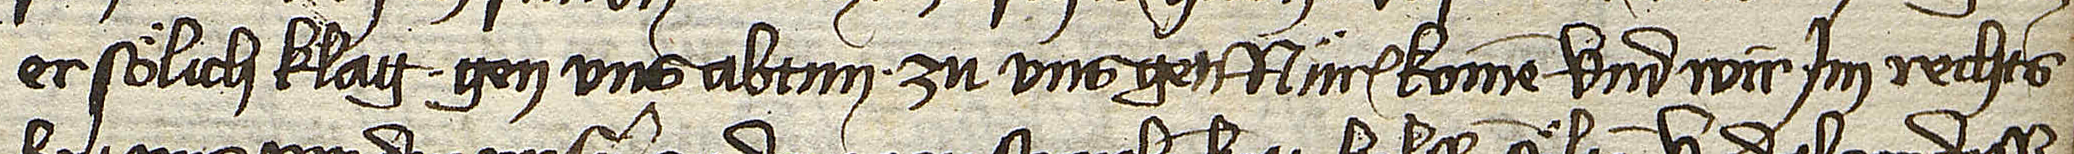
er ſölich klag . gen vns abtun . ʒu vns gen Nür* kome* Vnd wir Im rechts
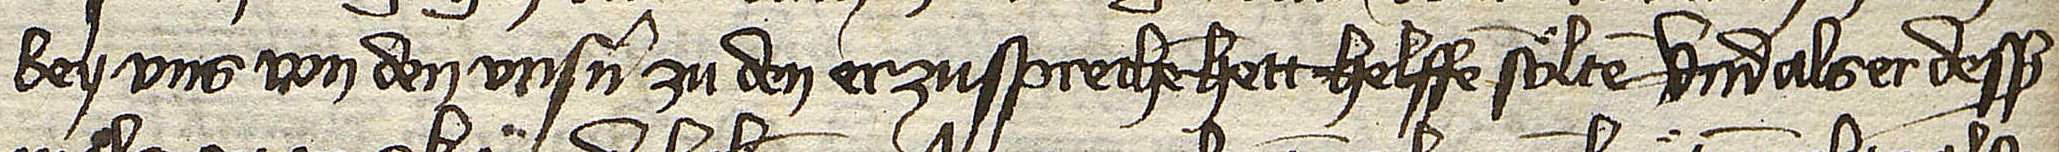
bey vns vnd den vnſn* ʒu den er ʒu ſpreche* hett helffe* ſölte* Vnd als er deſſ*
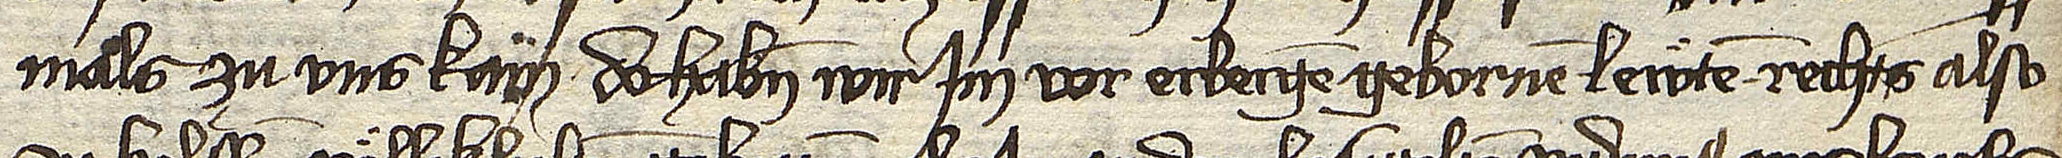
mals ʒu vns kam / Do habn* wir Im vor erberge* geborne* leẅte* rechts alſo
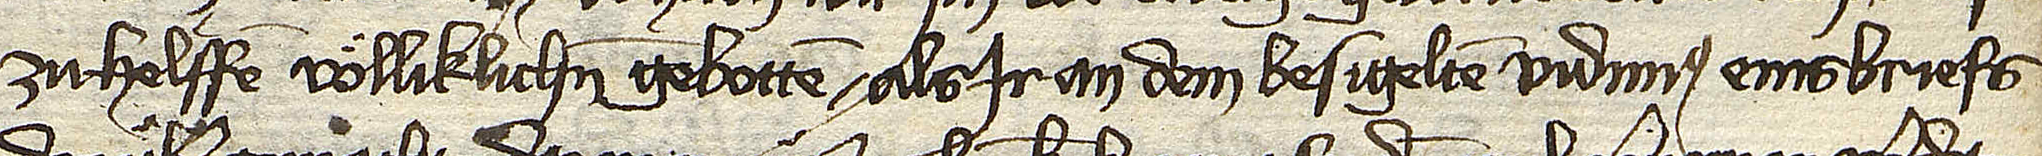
ʒu helffe* völliklichn* gebotte* / als Ir an dem beſigelte* vidim* eins briefs
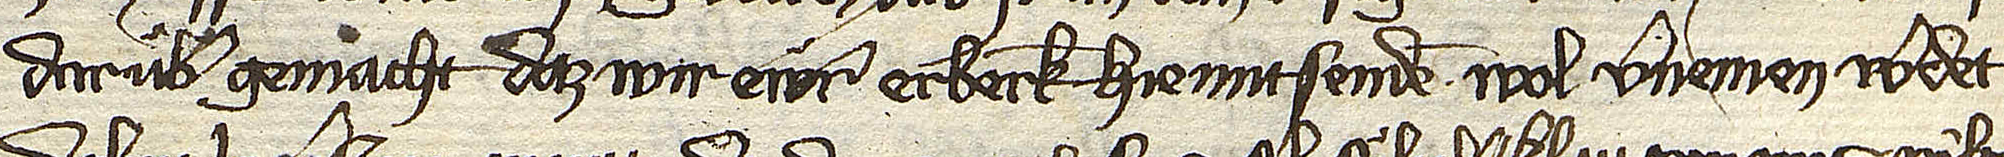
darüb* gemacht daʒ wir eẅr* erberk* hie mit ſende* wol v*nemen w*det
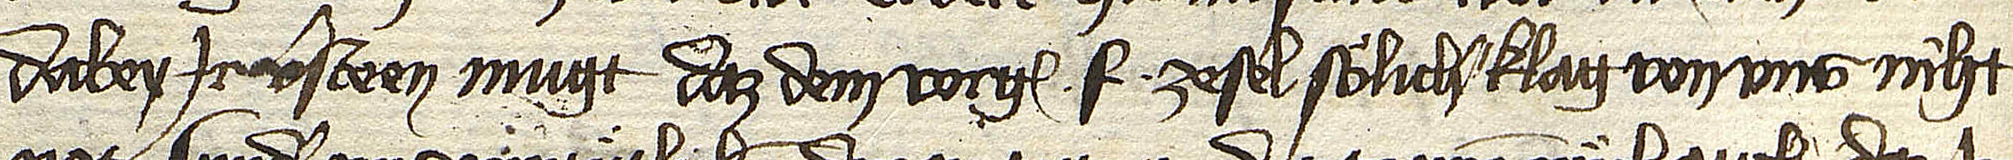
Dabey Ir v*ſteen mugt daʒ dem vorg* . f . ʒeſel ſölich* klag von vns niht
